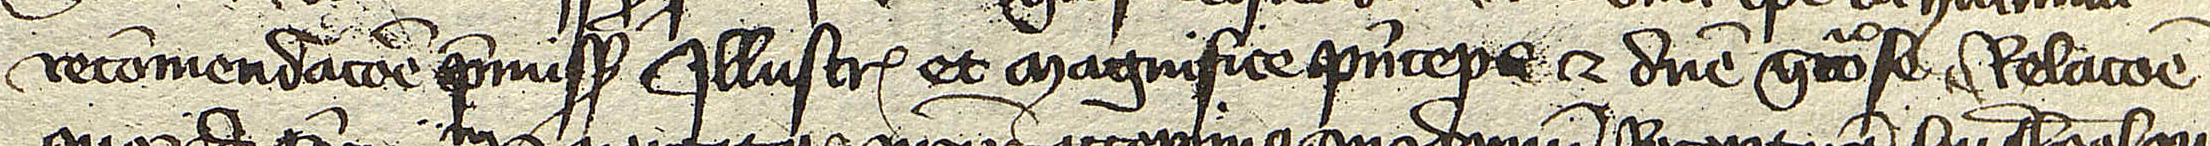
recom*endac*o*e p*miſſ*. Illuſtr* et Magnifice p*nceps @ d*ne g*r*oſe / Relac*o*e
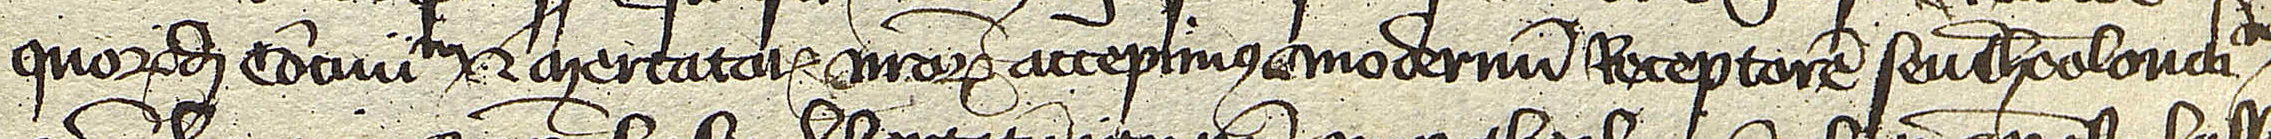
quo*d* Co*ciui*m @ Mercator* n*ro* accepim* / modernu* Receptore* ſeu Theolonda*
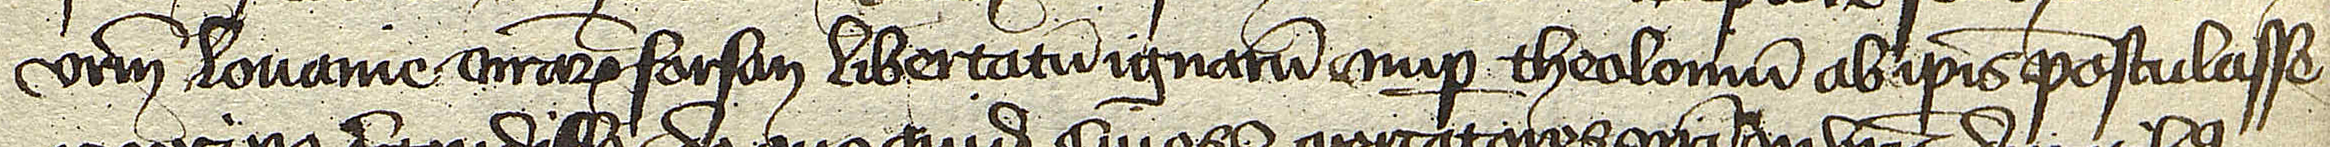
v*r*m Louanie / n*ra* forſ*an libertatu* ignaru* / nup* theoloniu* ab ip*is poſtulaſſe
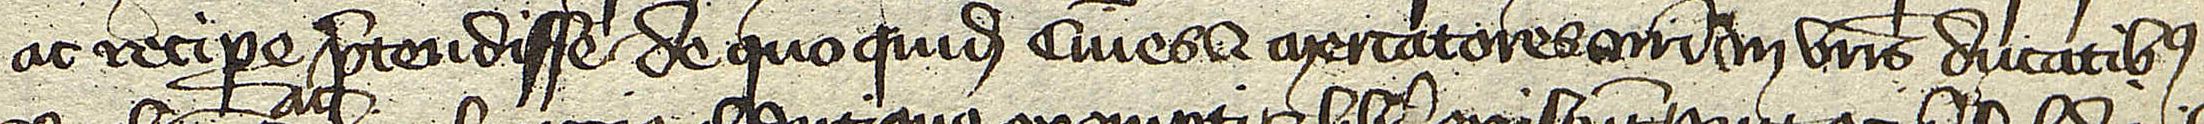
ac recip*e / p*tendiſſe de quo quid Ciues @ Mercatores n*ri in v*ris ducatib*
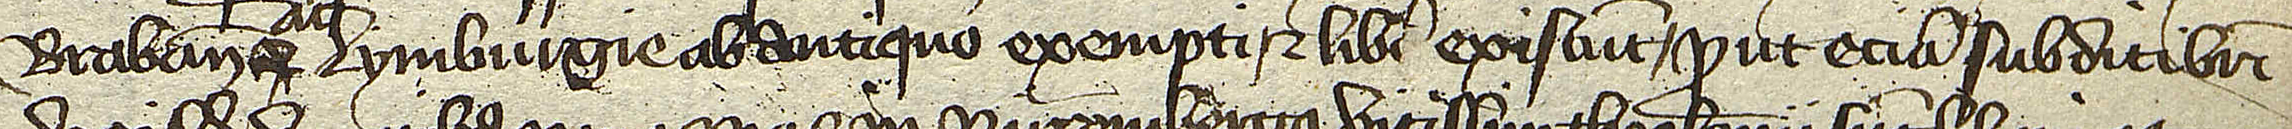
Braban* @ Lymburgie ab Antiquo exempti / @ lib*i exiſan* / P*ut ecia* ſub dici* v*r*
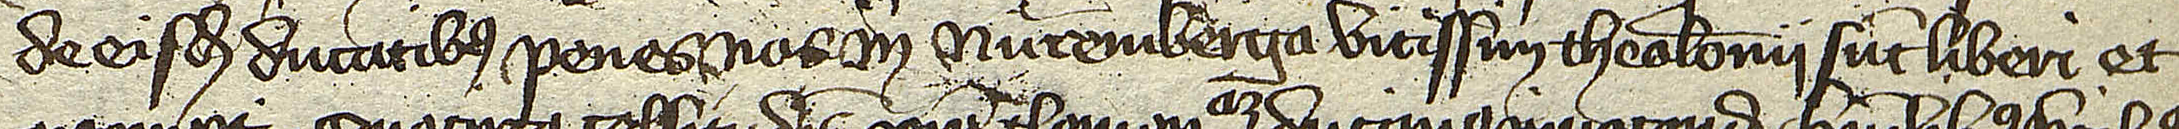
de eiſd* ducatib* penes nos in Nuremberga vitiſſim* theolonii ſu*t liberi et
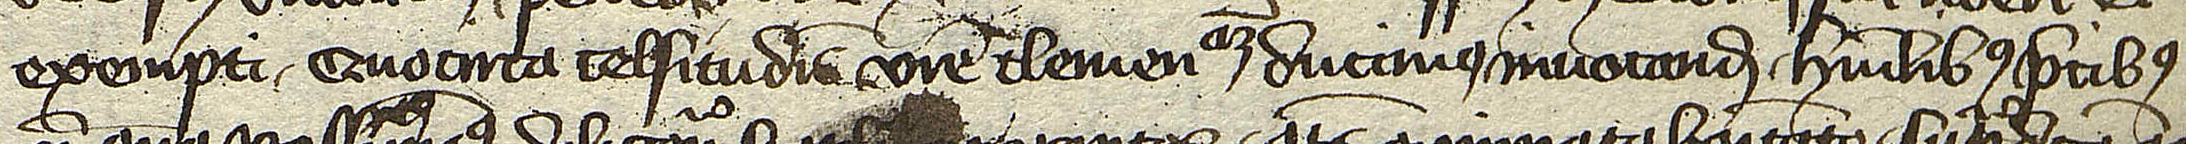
exempti / Quocirca celſitudi*s v*r*e clemen* ducim* inuocand* / hui*lib* / p*cib*
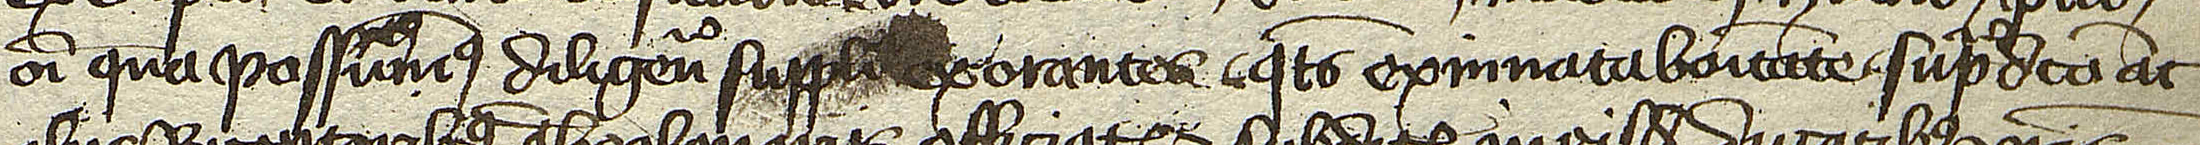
o*i quo poſſum* diligen* ſuppli* exorantes / q*t*s exinnata bo*itate ſup*d*c*a ac
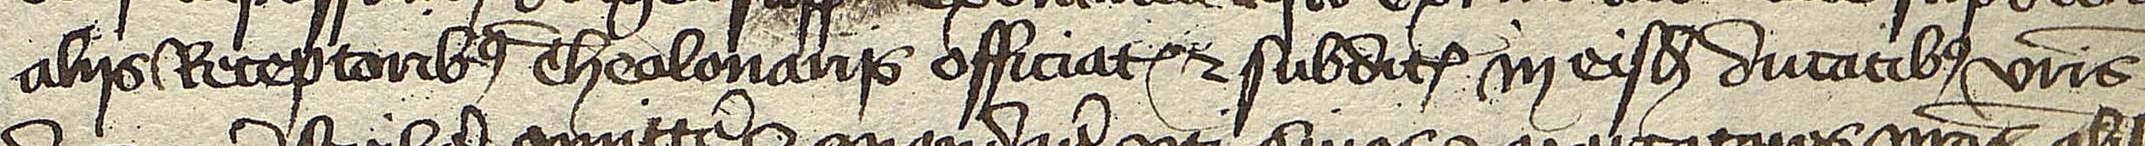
aliis Receptorib* Theolonariis officiat* @ ſubdi*t* in eiſd* ducatib* v*ris
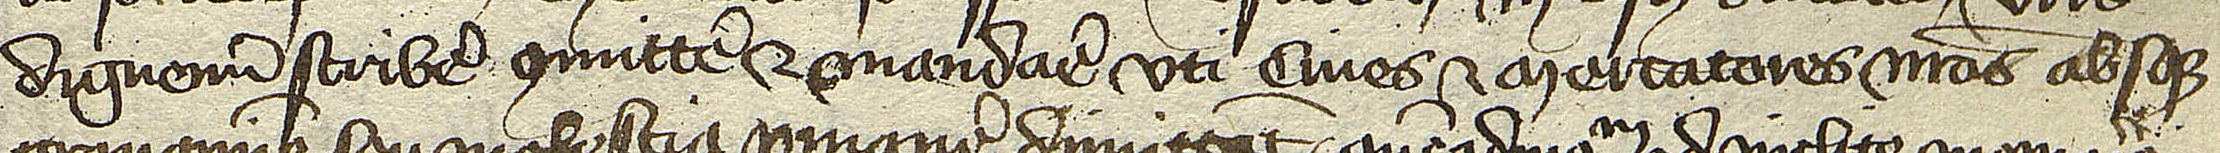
Dignem* ſcribe* *mitte* @ manda*e vti Ciues @ Mercatores n*ros abſ*
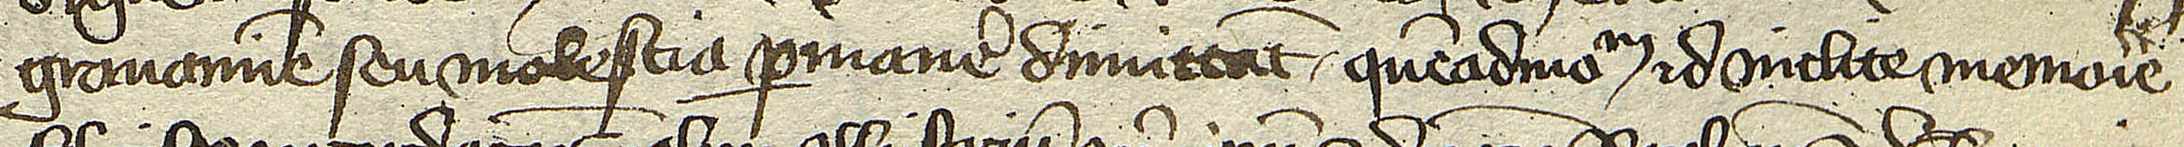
grauami*e ſeu moleſtia p*mane* dimitta*t / que*admo* id milite memo*ie
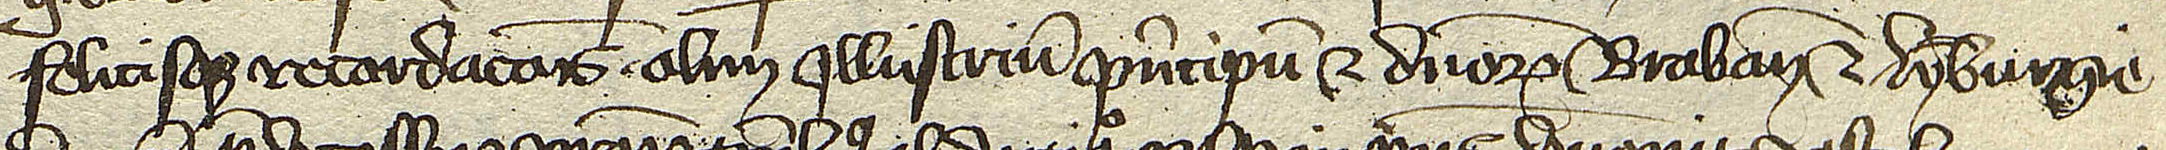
feliciſ* recordatio*is / olim Illuſtriu* p*ncipu* @ d*no* Braban* @ Ly*burgie
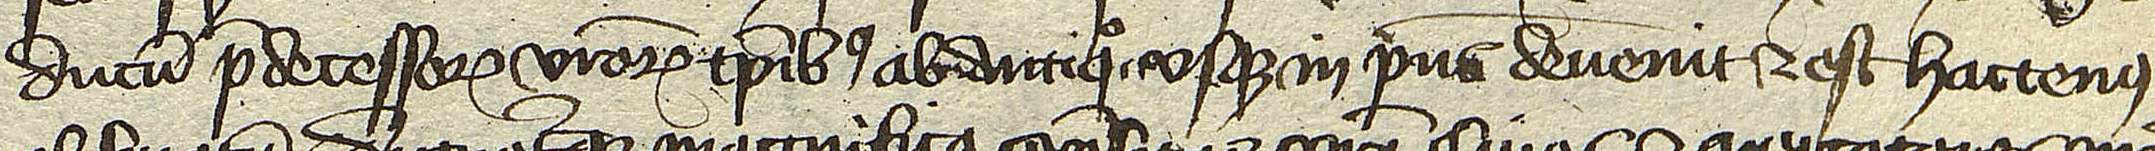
ducu* p*deceſſ* v*ro* t*p*ib* ab Antiq*o / uſq* in p*ns deuenit @ eſt hacten*
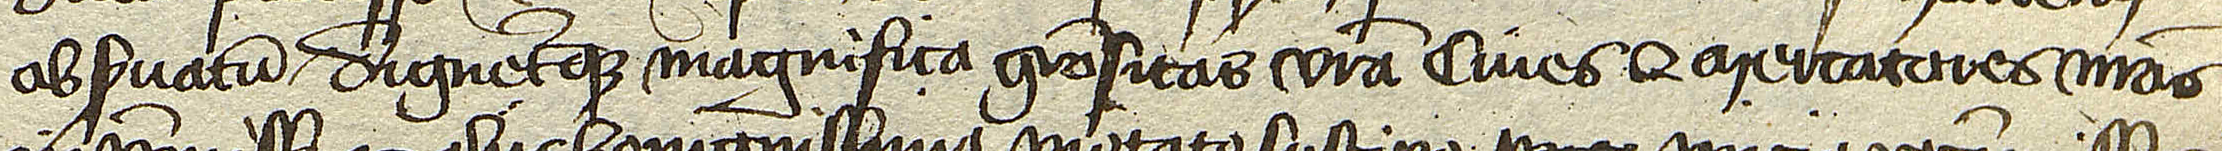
obſ*uatu* / Dignetq* magnifica g*r*oſitas v*ra Ciues @ Mercatores n*ros
